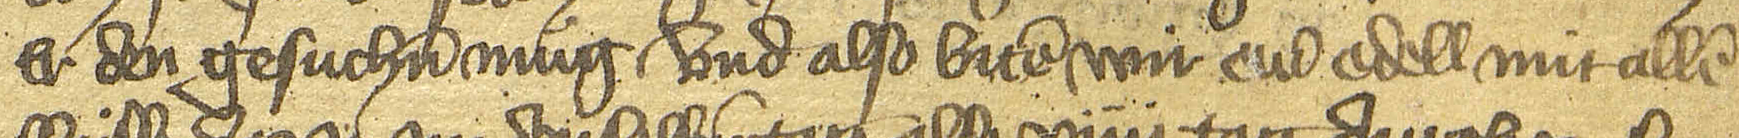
Er den geſuchn* müg / vnd alſo bite* wir ew* edell mit alle*
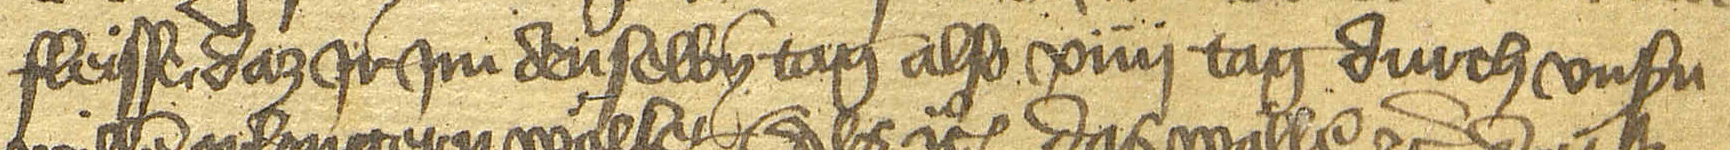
fleiſſe / daʒ Ir Im denſelbn* tag alſo xiiii tag durch vnſ*n
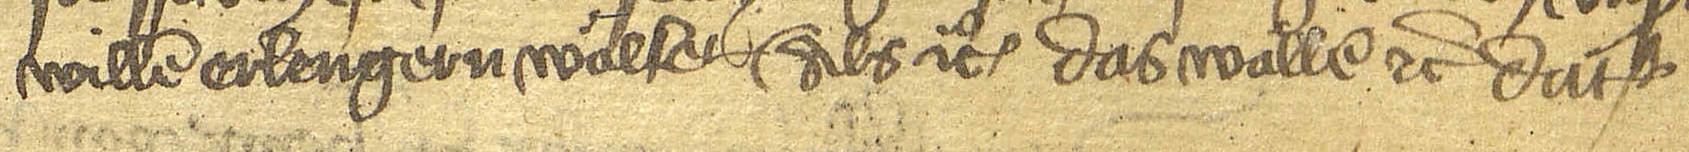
wille* erlengern wöllet / Als ec* das wölle* ec* Dat*
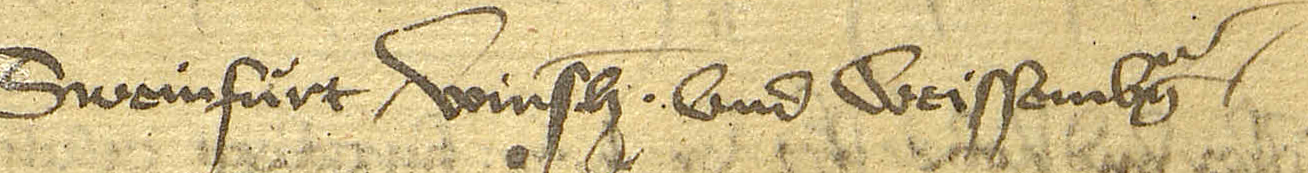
Sweinfürt / Winſh* . vnd Weiſſemb*g /
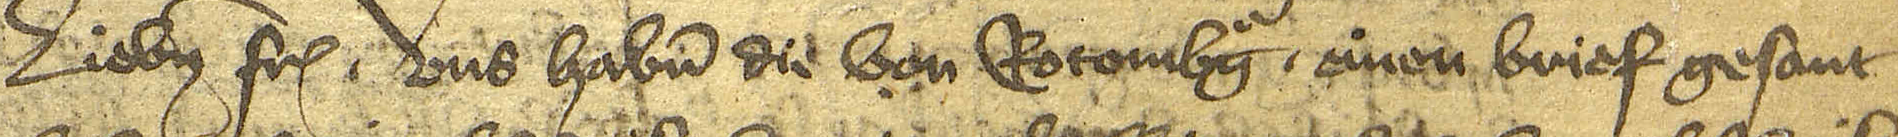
Liebn* fr* / Vns habn* die von Rotemb*g / einen brief geſant
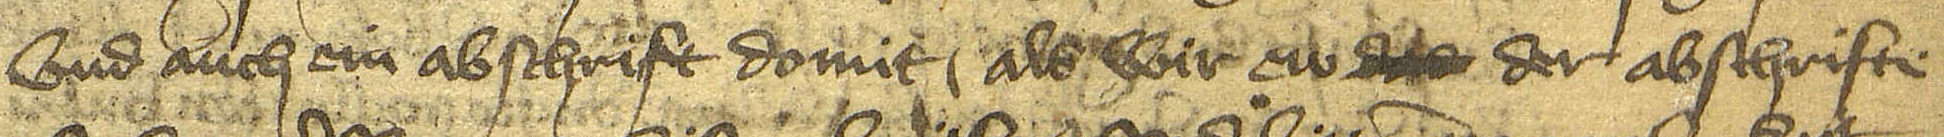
vnd auch ein abſchrift domit / als wir ew das der abſchrifte
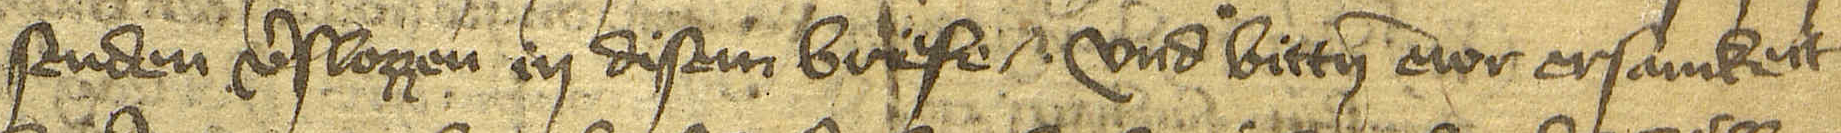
ſenden v*ſloʒʒen in diſem briefe / . vnd bittn* ewr erſamkeit
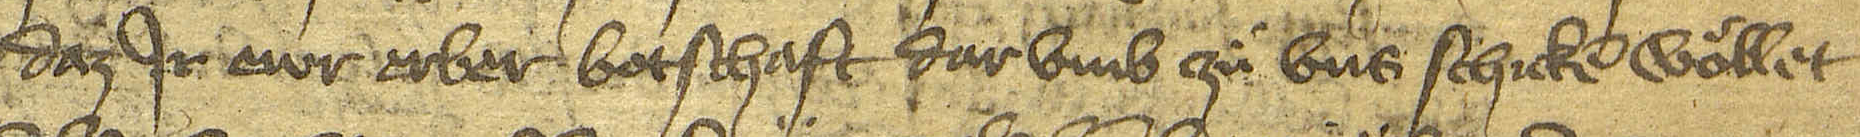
daʒ Ir ewr erber botſchaft darvmb cʒü vns ſchicke* wöllet
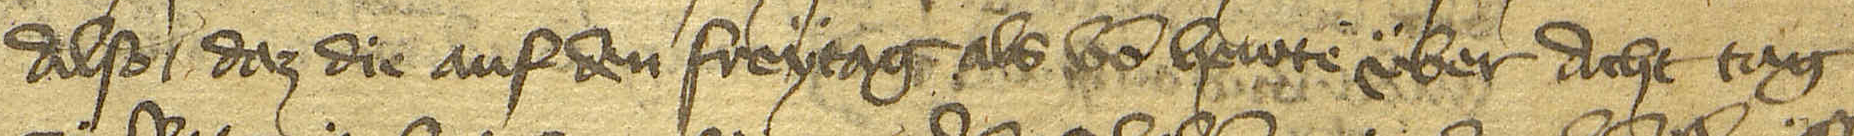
Alſo / daʒ die auf den freytag als vo* hewte v̈ber Acht tag
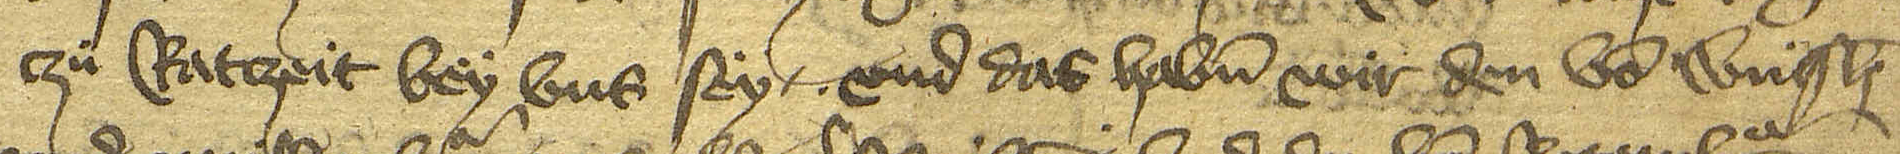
cʒü Ratcʒeit bey vns ſey / . vnd das habn* wir den vo* Winſh*
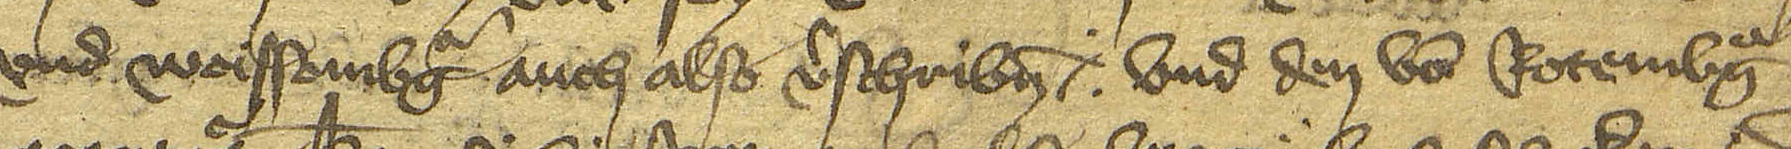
vnd weiſſemb*g auch alſo v*ſchribn* / . vnd den vo* Rotemb*g
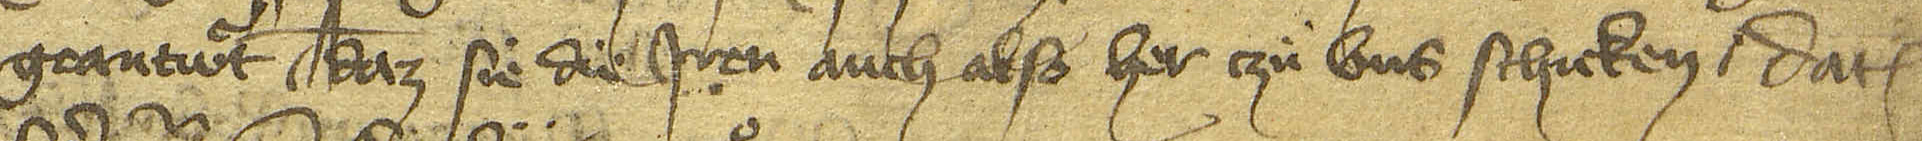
geantw*t / daʒ ſie die Iren auch alſo her cʒü vns ſchicken / Dat*
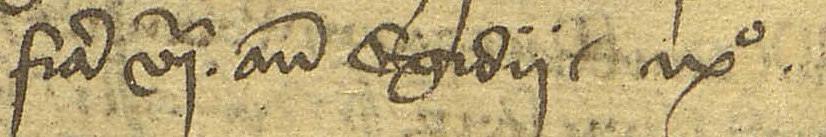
fia* vi* . an* Egidii / ix* .
